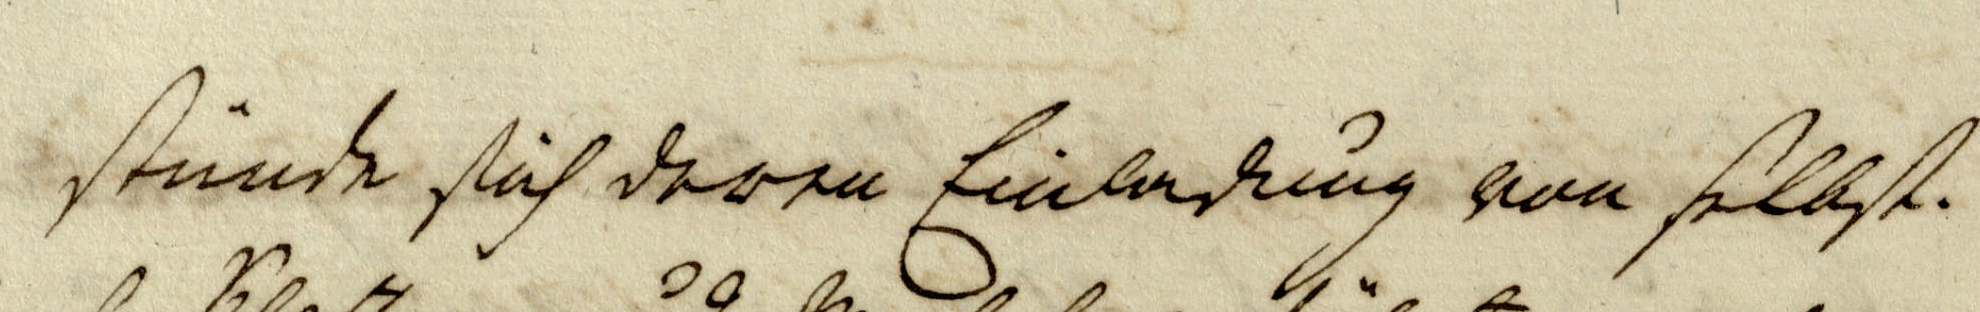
stünde sich deren Einladung von selbst.
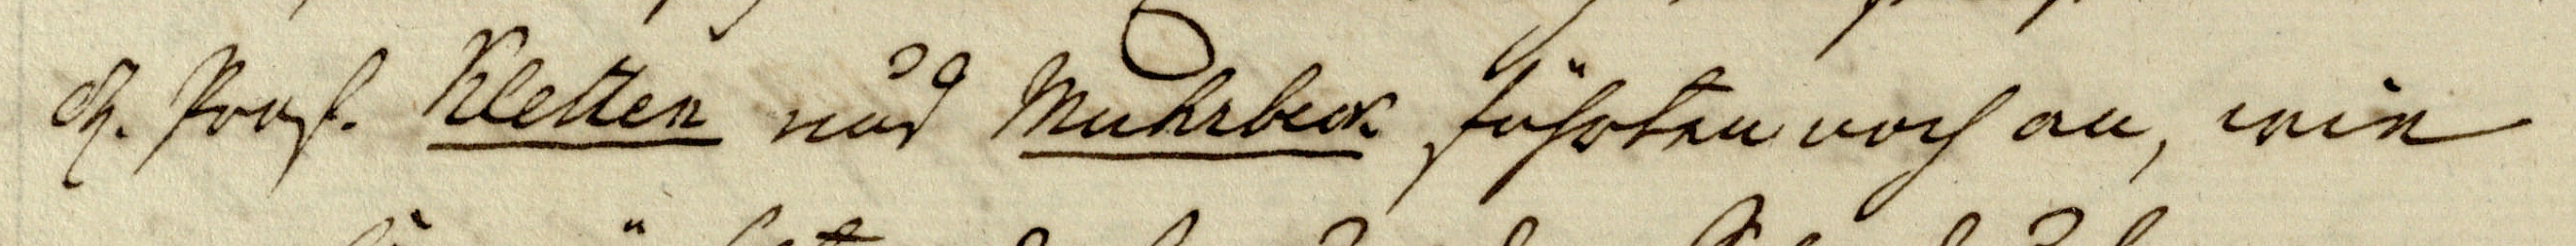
dh. Prof. Kletten und Muhrbeck führten noch an, wie
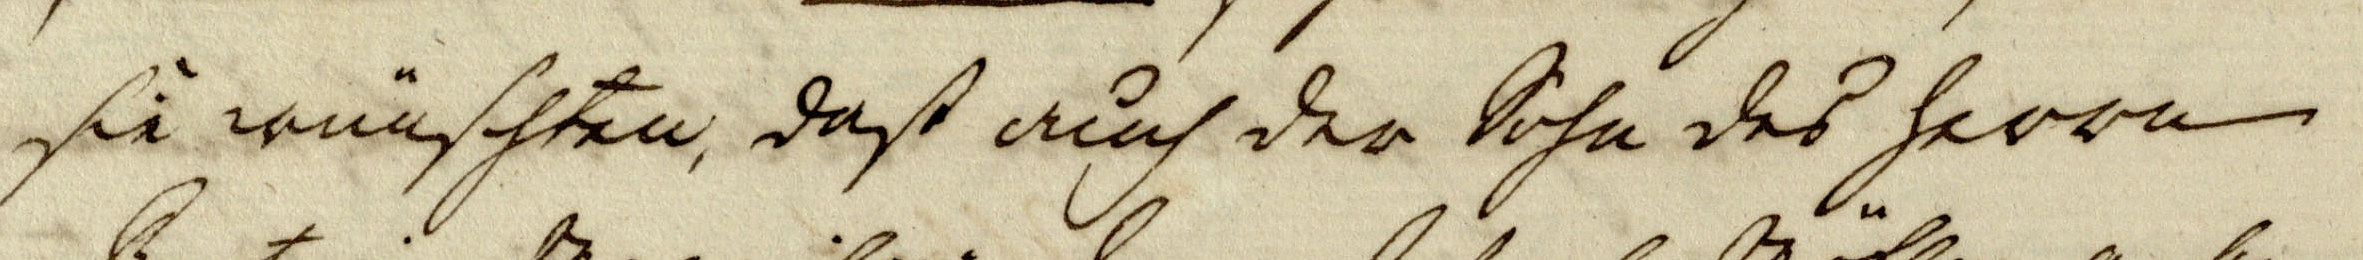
sie wünschten, daß auch der Sohn des Herrn
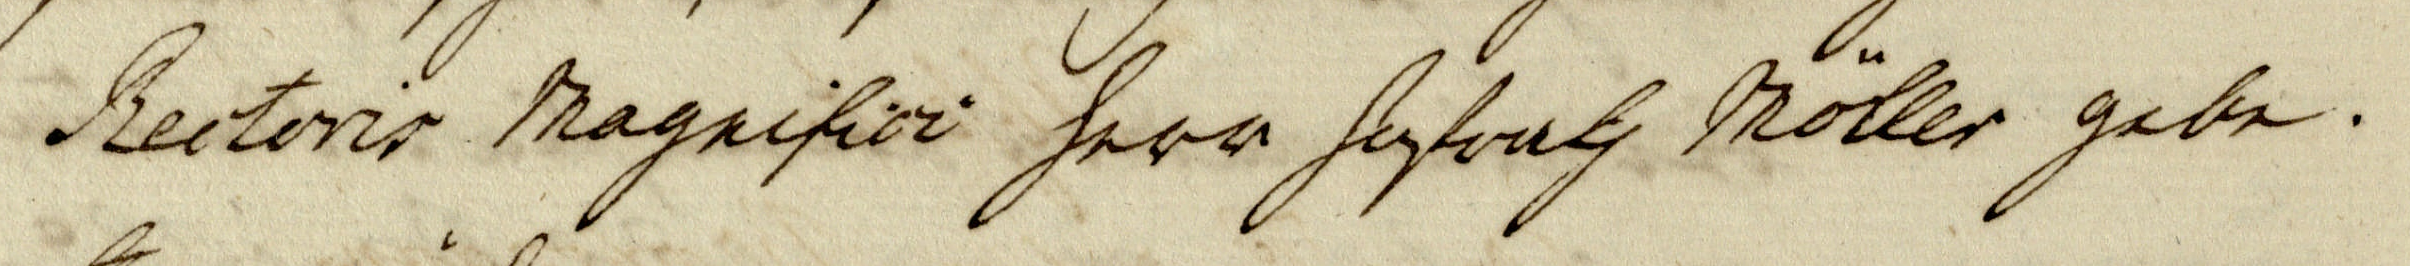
Rector Magnifici Herr Hofrath Möller gebe¬
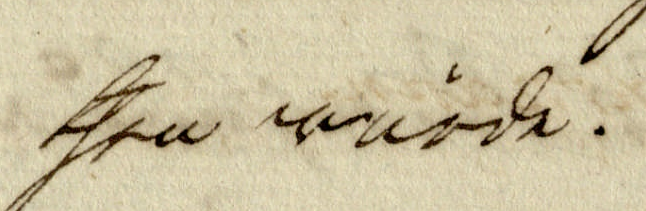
then würde.
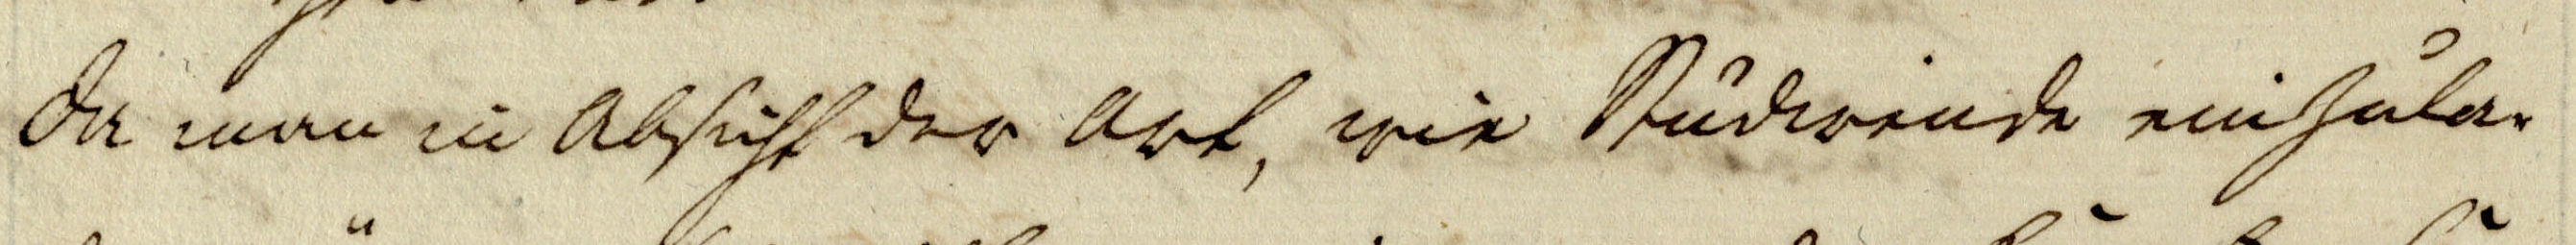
Da man in Absicht der Art, wie Studirende einzula¬
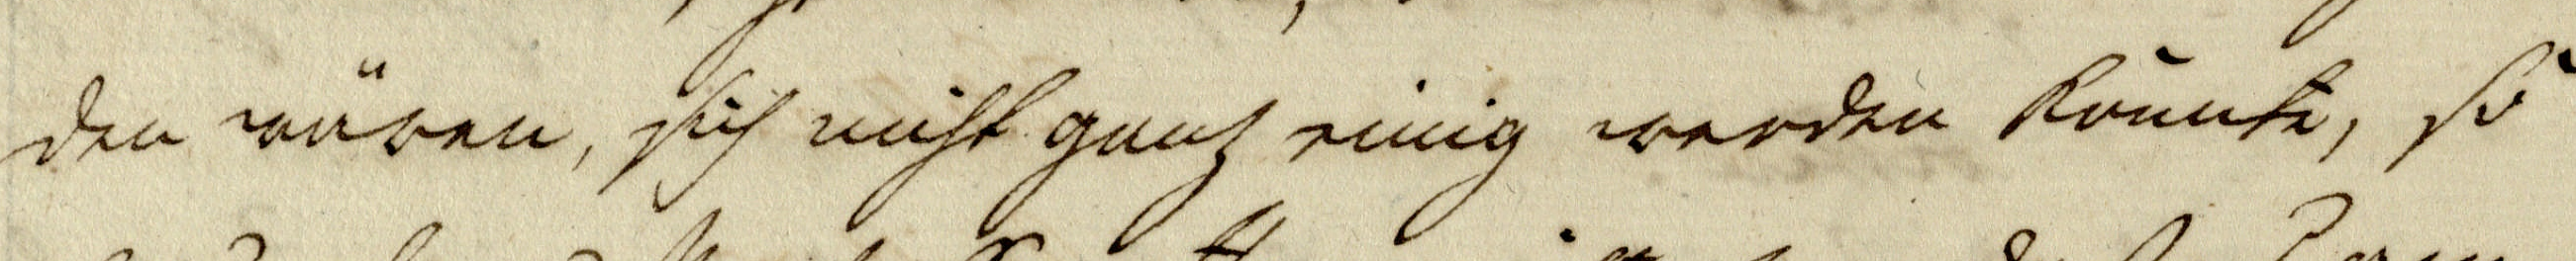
den wären, sich nicht ganz einig werden könnte, so
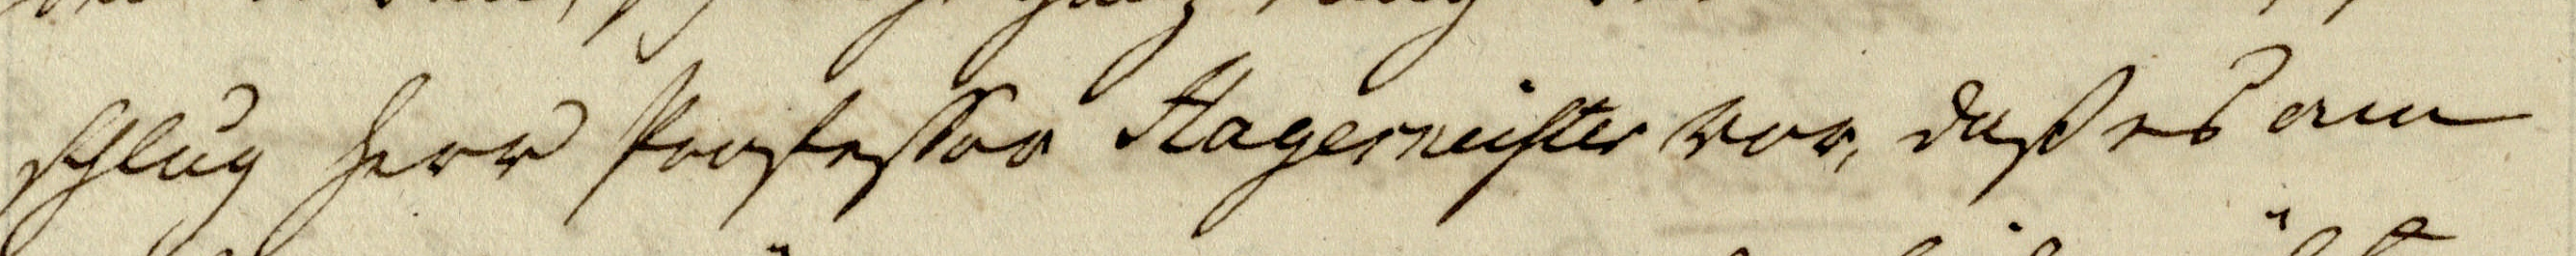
schlug Herr Professor Hagemeister vor, daß es am
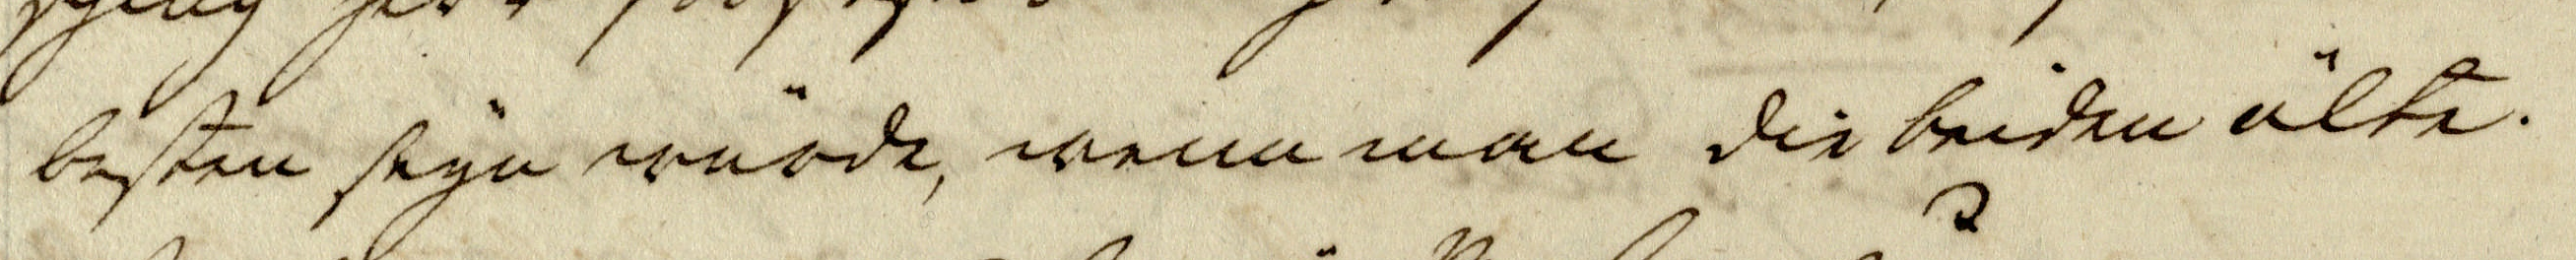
besten seÿn würde, wem man die beiden älte¬
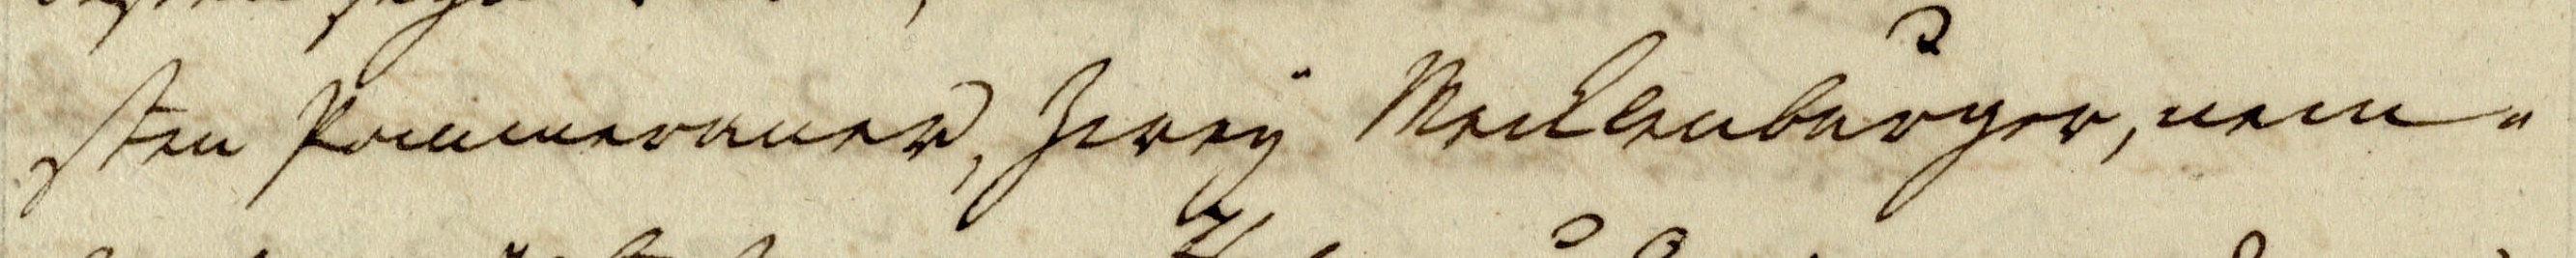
sten Pommeraner, zweÿ Mecklenburger, nem¬
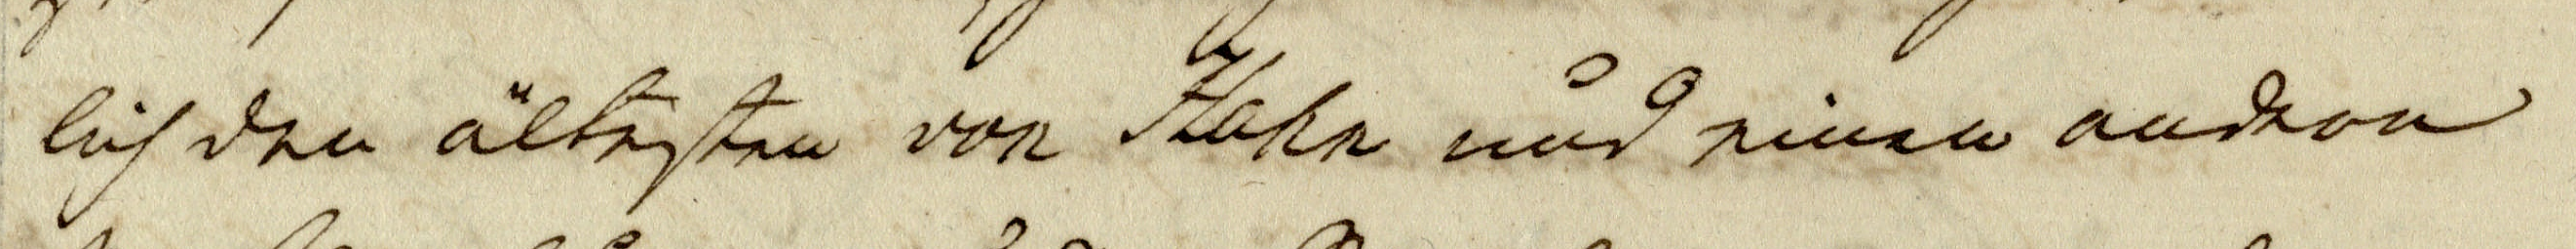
lich den ältesten von Hahn und einen andern
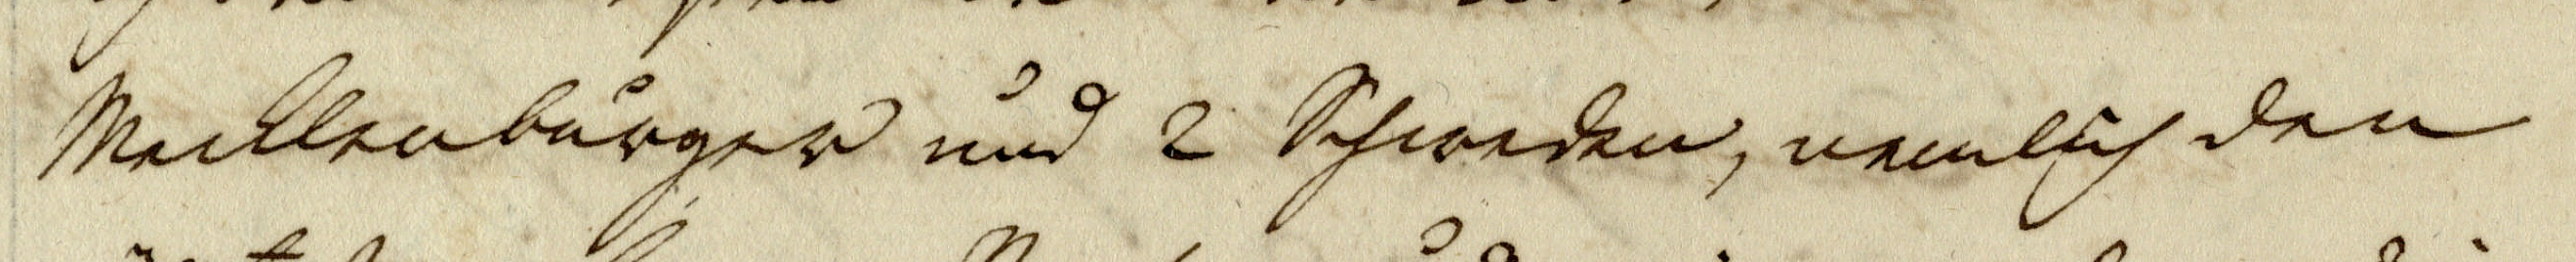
Mecklenburger und 2 Schweden, nemlich den
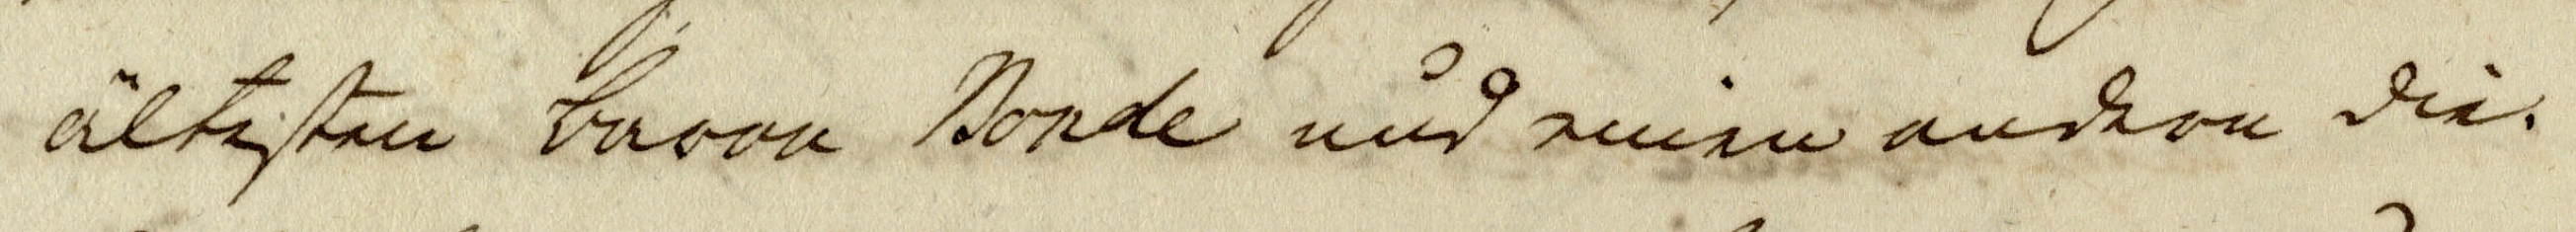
ältesten baron Bonde und einen andern die¬
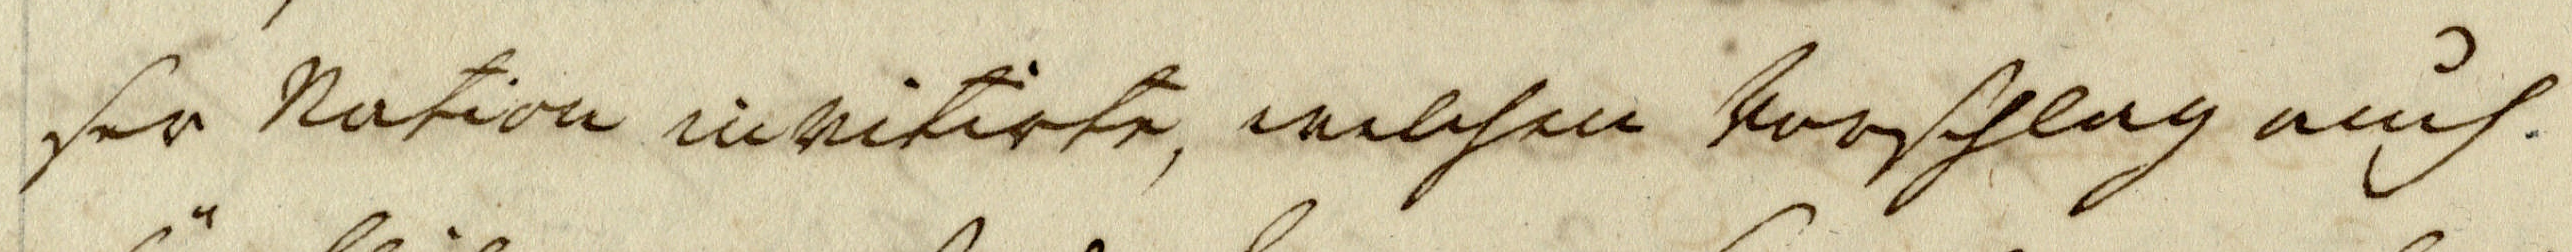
ser Nation invitirte, welchen Vorschlag auch
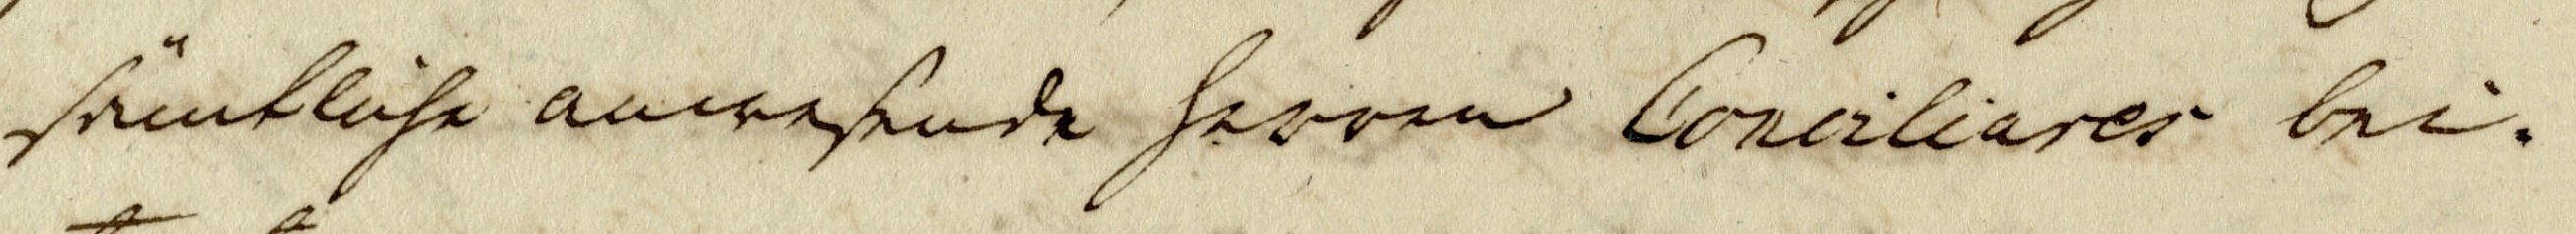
sämtliche anwesende Herren Conciliares bei¬
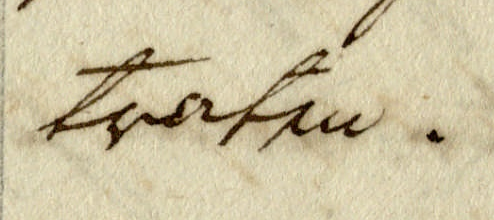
traten.
